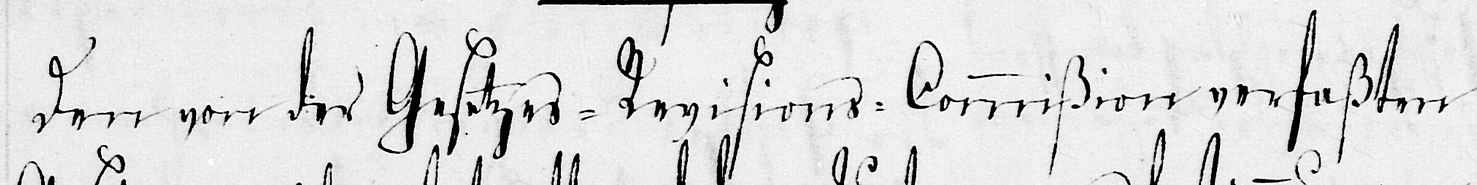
Den von der Gesetzes-Revisions-Commißion verfaßten
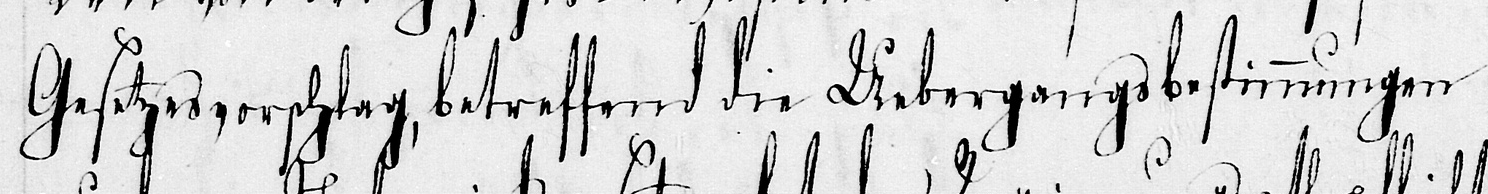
Gesetzesvorschlag, betreffend die Uebergangsbestimmungen
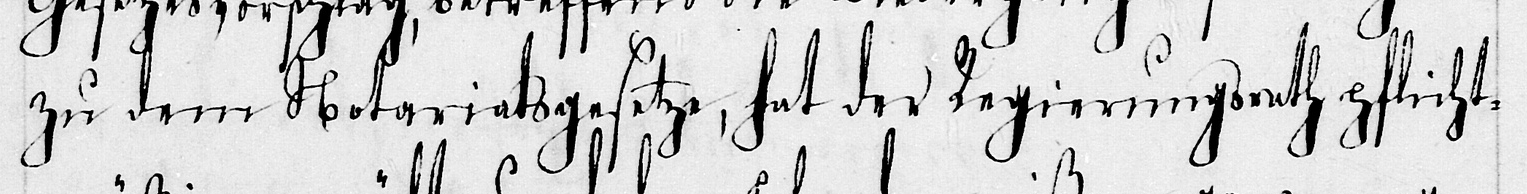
zu dem Notariatsgesetze, hat der Regierungsrath pflicht¬
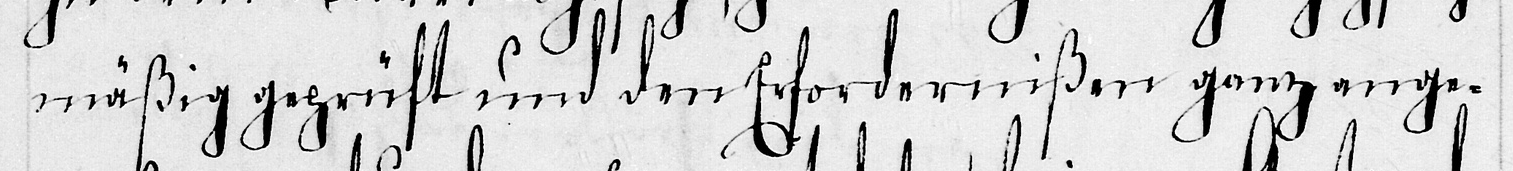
mäßig geprüft und den Erfordernißen ganz ange¬
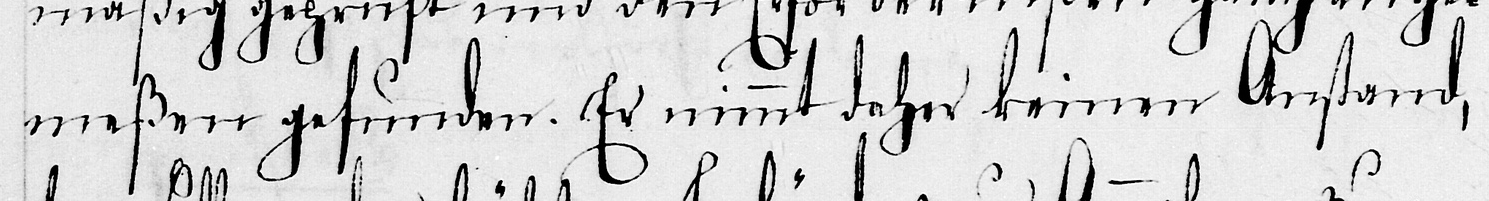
meßen gefunden. Er nimmt daher keinen Anstand,
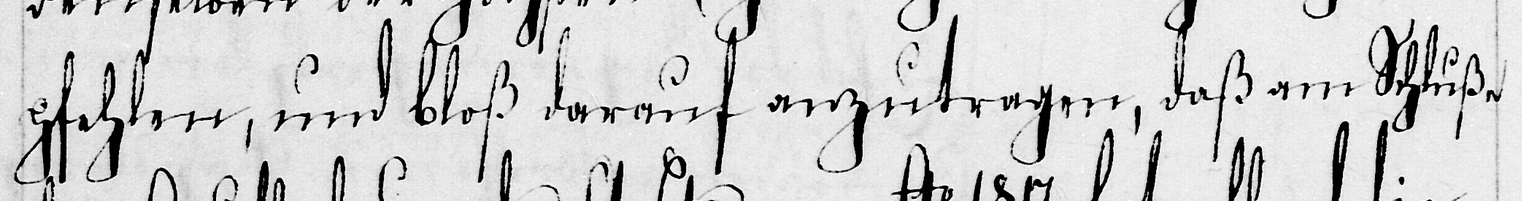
pfehlen, und bloß darauf anzutragen, daß am Schluße
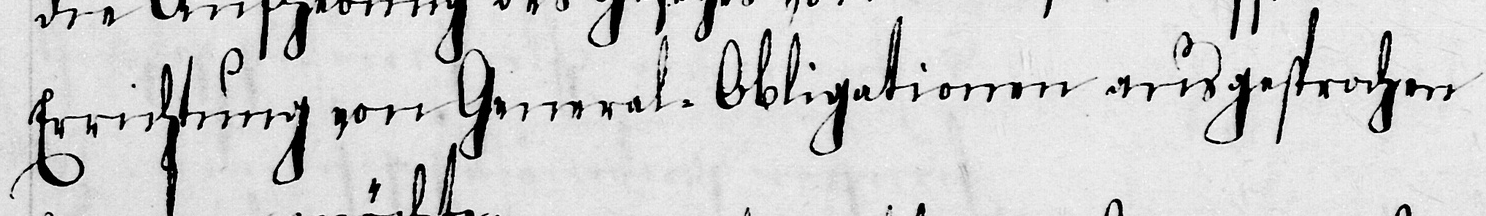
Errichtung von General-Obligationen ausgesprochen
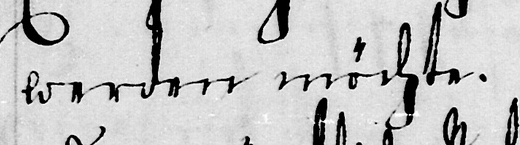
werden möchte.
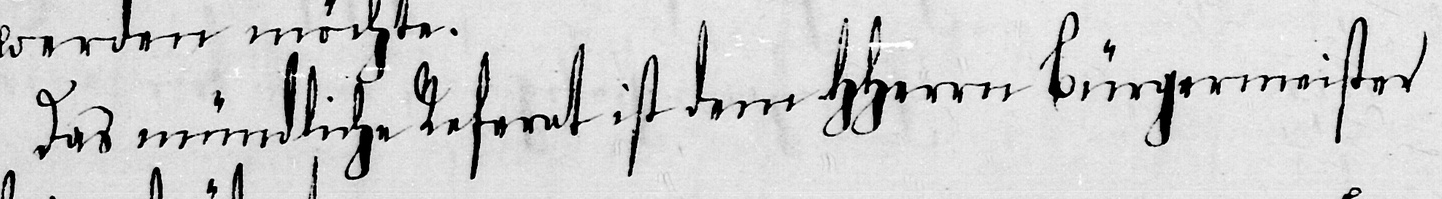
Das mündliche Referat ist dem HHerrn Bürgermeister
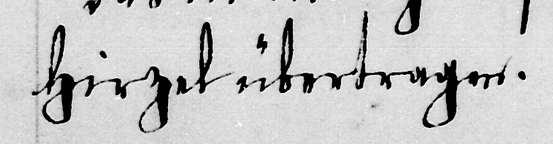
Hirzel übertragen.
